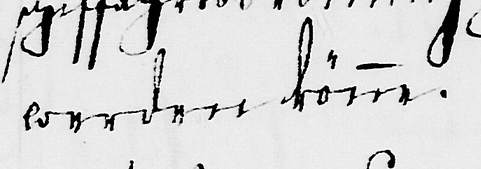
werden könne.
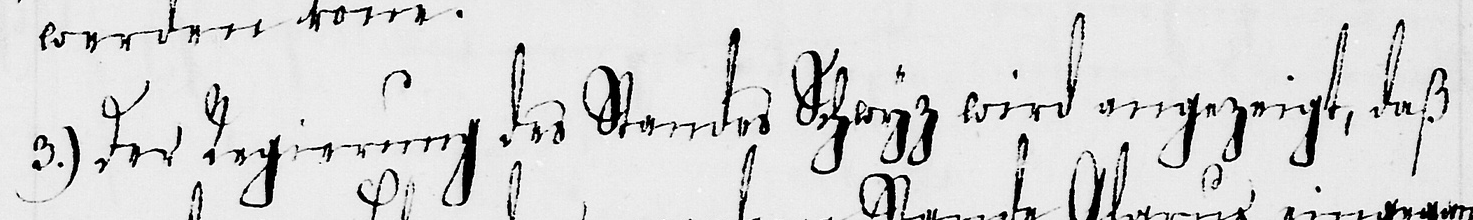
3.) Der Regierung des Standes Schwyz wird angezeigt, daß
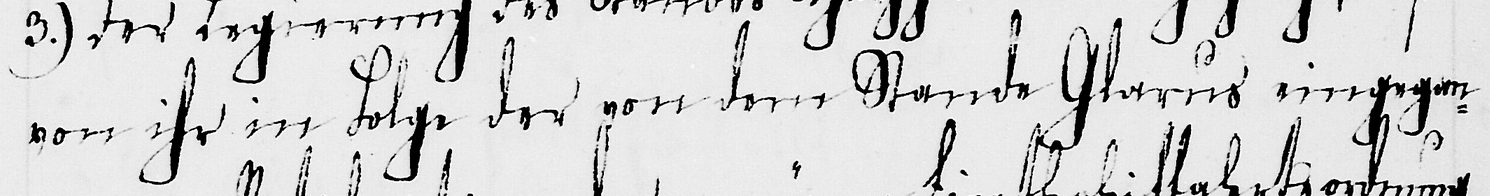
von ihr in Folge der von dem Stande Glarus eingegan¬
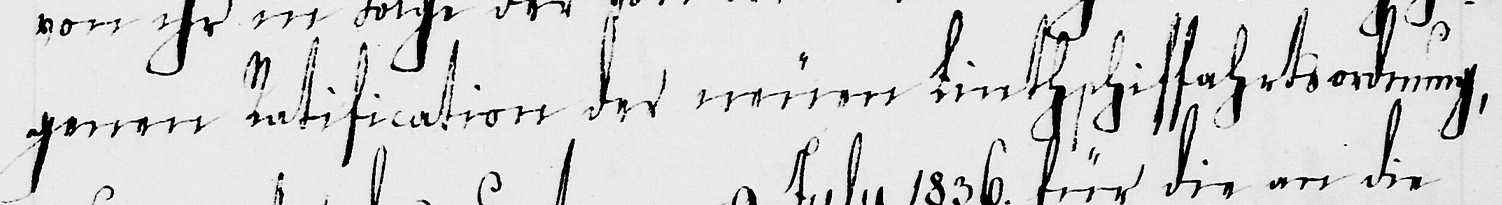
genen Ratification der neuen Linthschiffahrtsordnung,
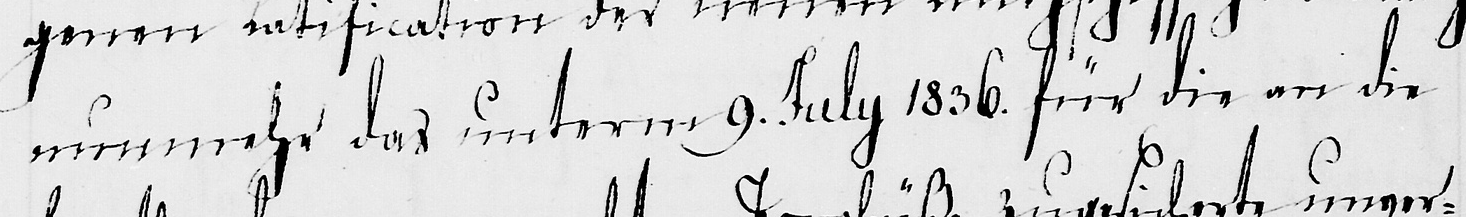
nunmehr das unterm 9. July 1836. für die an die
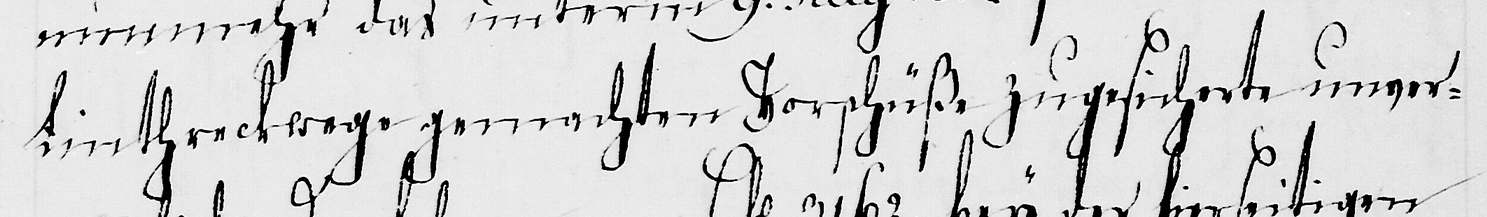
Linthreckwege gemachten Vorschüße zugesicherte unver¬
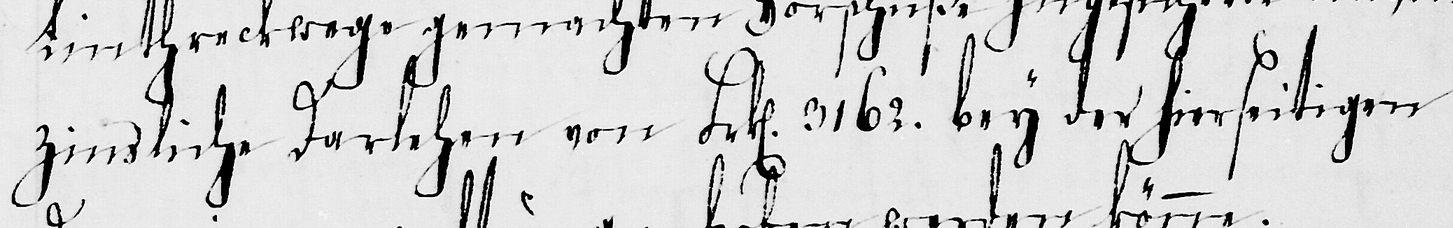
zinsliche Darlehen von Frk[en]. 3162. bey der hierseitigen
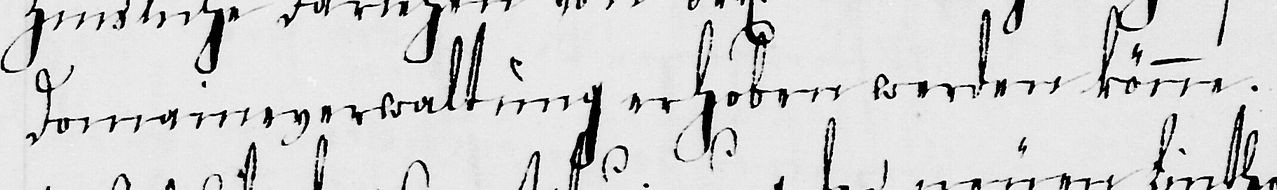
Domaineverwaltung erhoben werden könne.
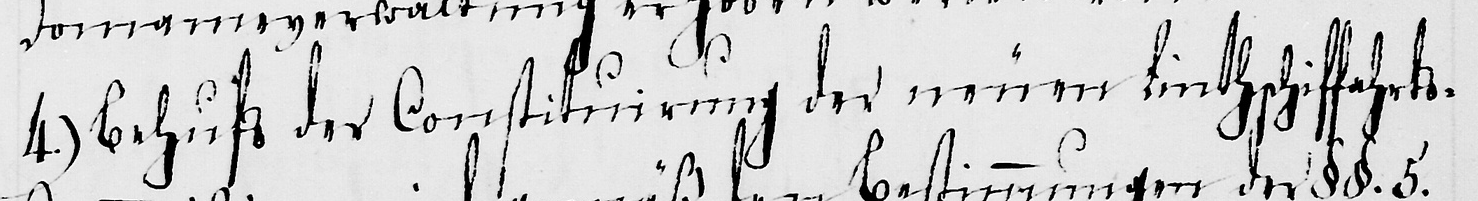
4.) Behufs der Constituirung der neuen Linthschiffahrt¬
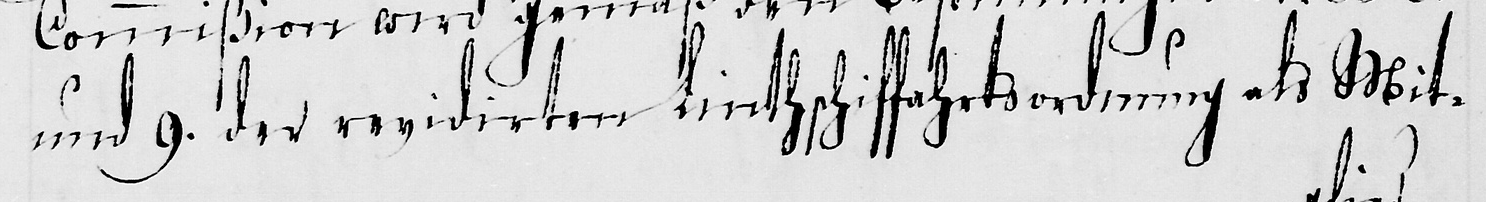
und 9. der revidirten Linthschiffahrtsordnung als Mit-
